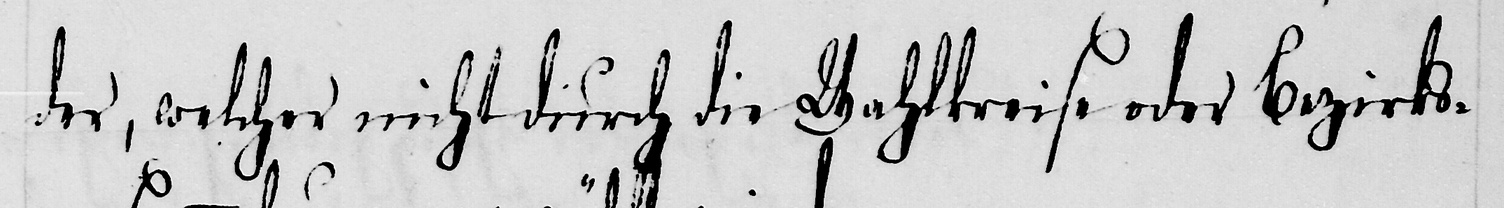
der, welcher nicht durch die Wahlkreise oder Bezirks¬
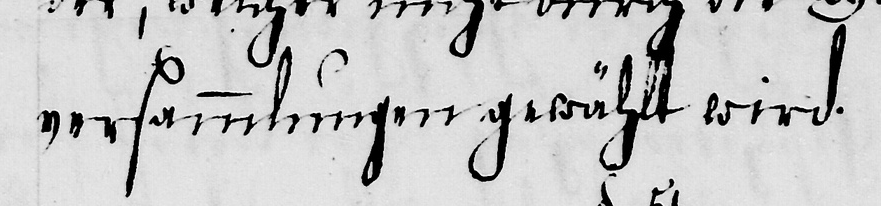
versammlung gewählt wird.
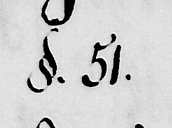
§. 51.
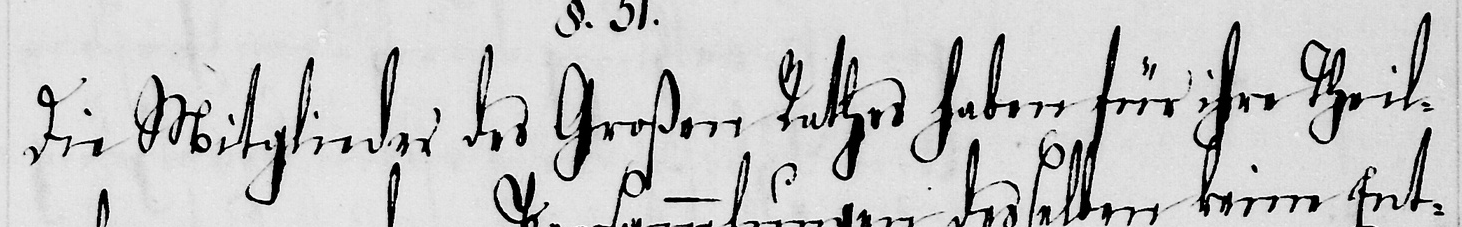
Die Mitglieder des Großen Rathes haben für ihre Theil¬
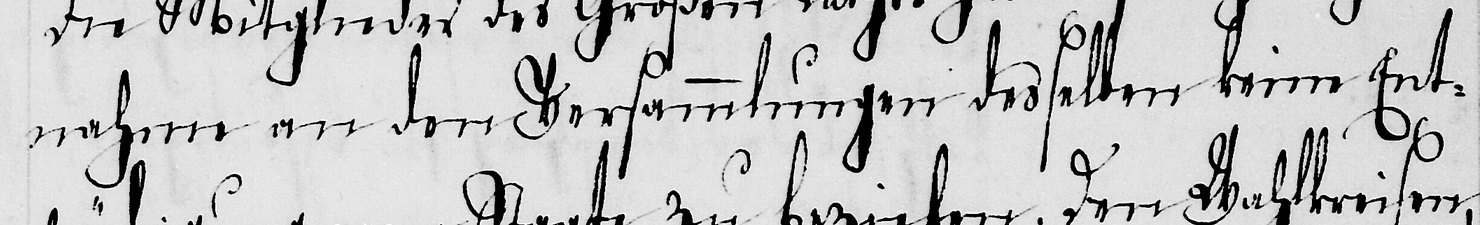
nahme an den Versammlungen desselben keine Ent¬
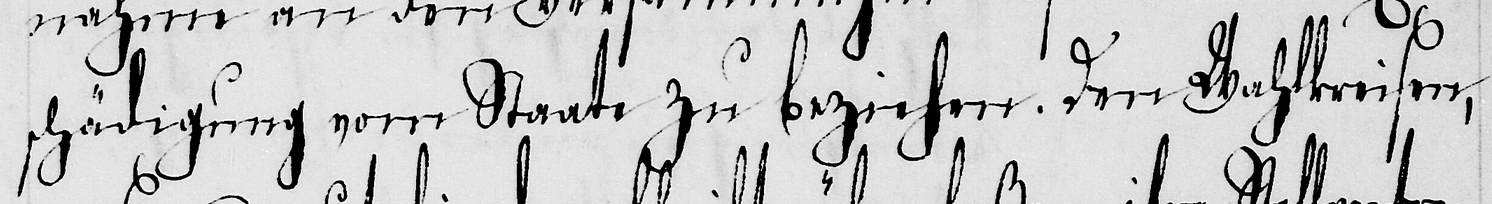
schädigung vom Staate zu beziehen. Den Wahlkreisen,
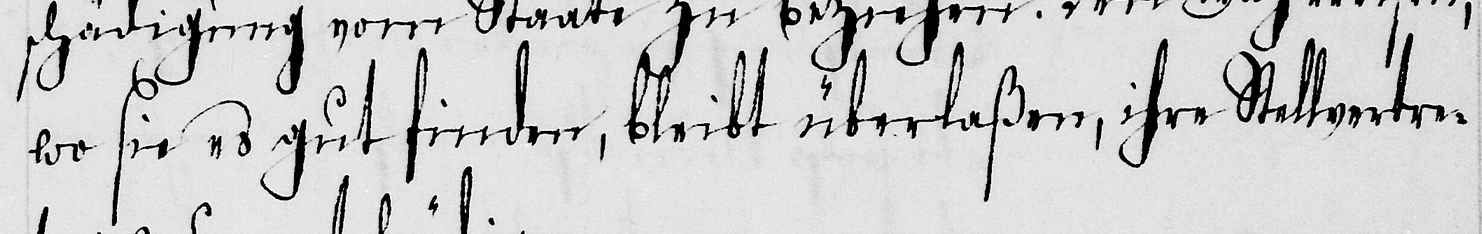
wo sie es gut finden, bleibt überlaßen, ihre Stellve¬
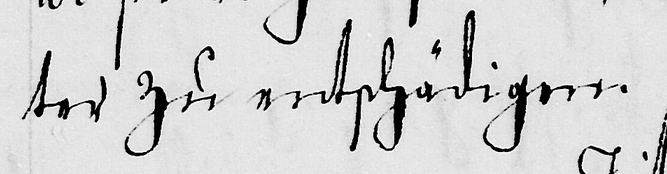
ter zu entschädigen
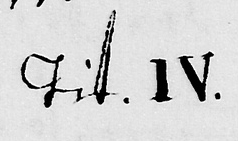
Tit. IV.
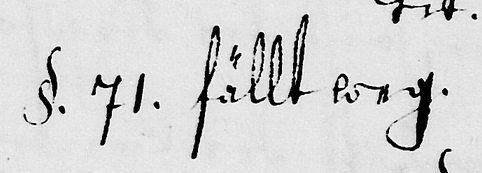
§. 71. fällt weg
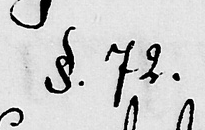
§. 72.
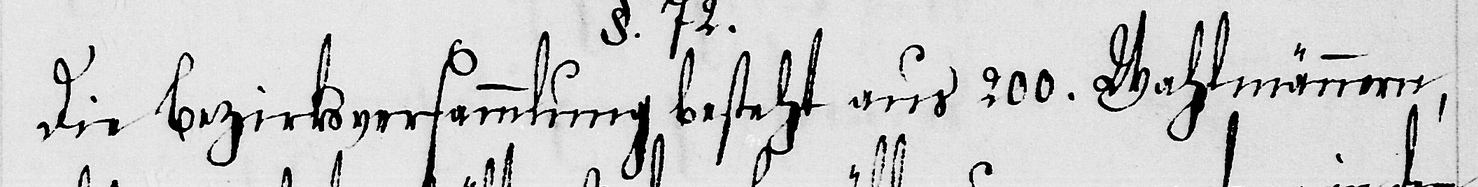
Die Bezirksversammlung besteht aus 200. Wahlmännern,
